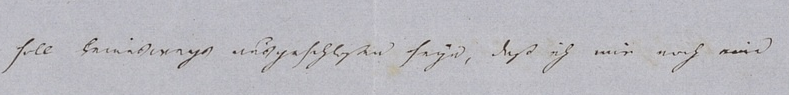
soll keineswegs ausgeschlossen seyn, daß ich mir noch eine
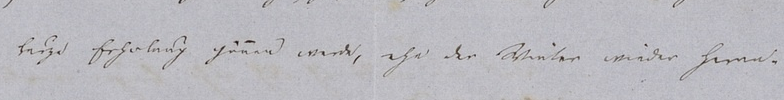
kurze Erholung gönnen werde, ehe der Winter wieder heran-
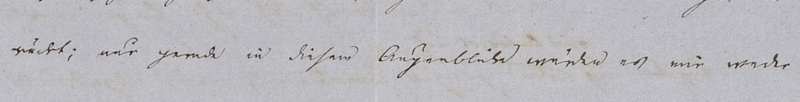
rückt; nur gerade in diesem Augenblicke würden es mir weder
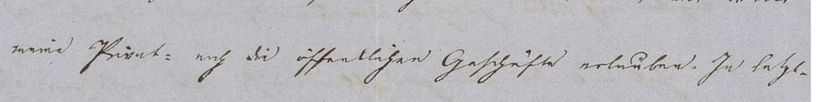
meine Privat- noch die öffentlichen Geschäfte erlauben. In letzt-
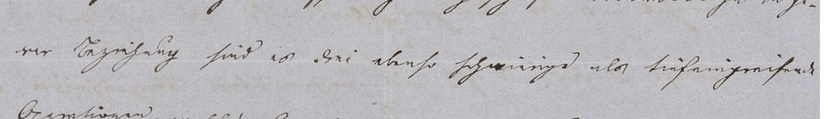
rer Beziehung sind es drei ebenso schwierige als tiefeingreifende
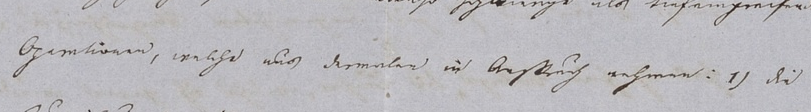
Operationen, welche uns dermalen in Anspruch nehmen: 1) die
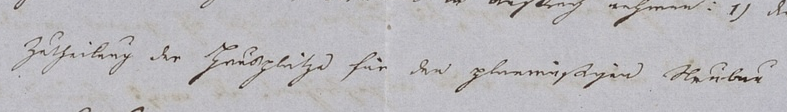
Zutheilung der Hausplätze für den planmäßigen Neubau
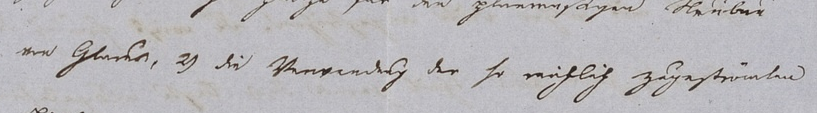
von Glarus, 2) die Verwendung der so reichlich zugeströmten
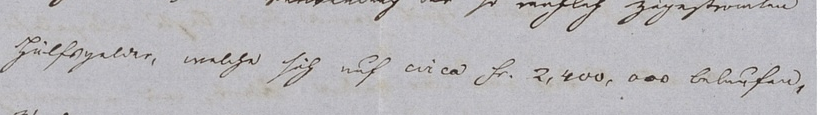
Hülfsgelder, welche sich auf circa Fr. 2,400,000 belaufen,
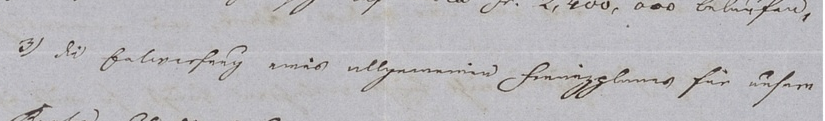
3) die Entwerfung eines allgemeinen Finanzplanes für unsern
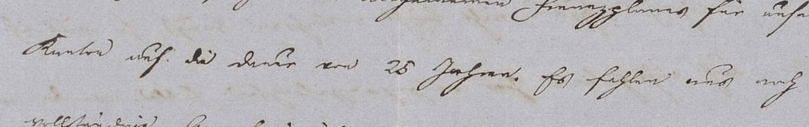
Kanton auf die Dauer von 25 Jahren. Es fehlen uns noch
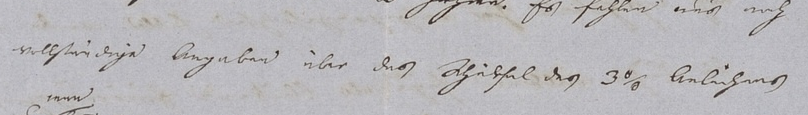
vollständige Angaben über das Schicksal des 3% Anleihens
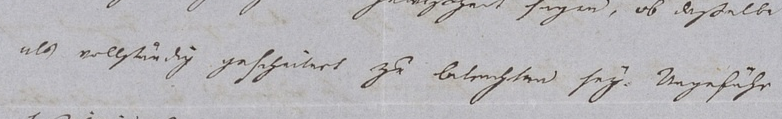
als vollständig gescheitert zu betrachten sey. Ungefähr
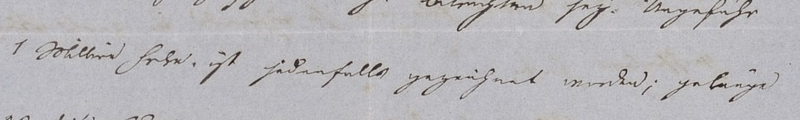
1 Million Frkn. ist jedenfalls gezeichnet worden; gelänge
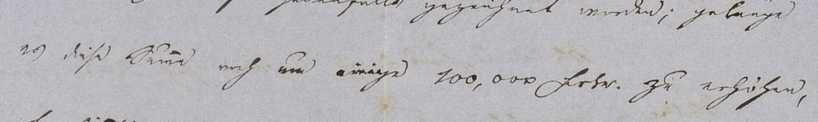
es diese Summe noch um einige 100,000 Frkn. zu erhöhen,
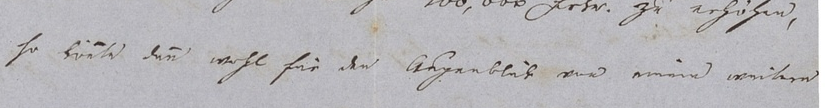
so könnte wohl für den Augenblick von einem weitern
